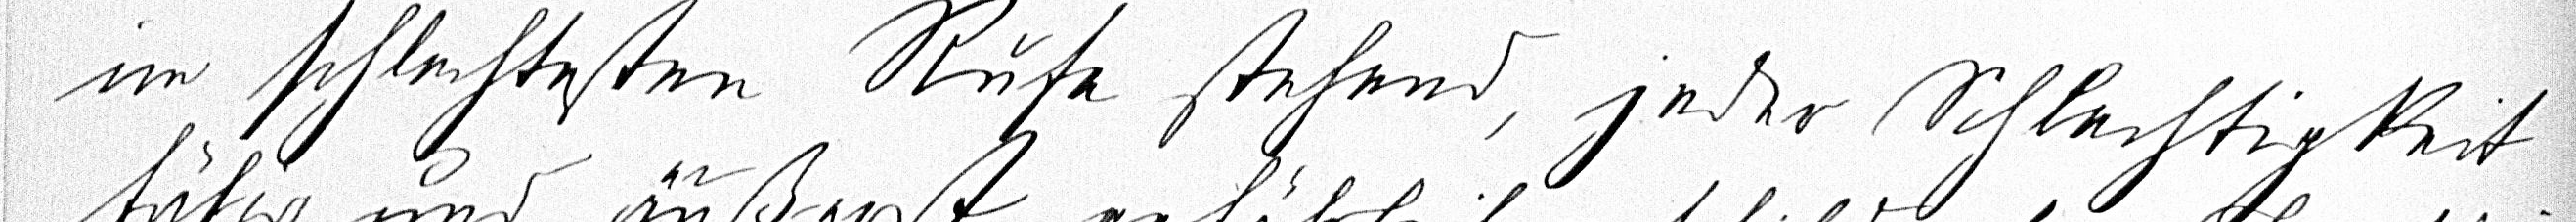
im schlechtesten Rufe stehend, jeder Schlechtigkeit
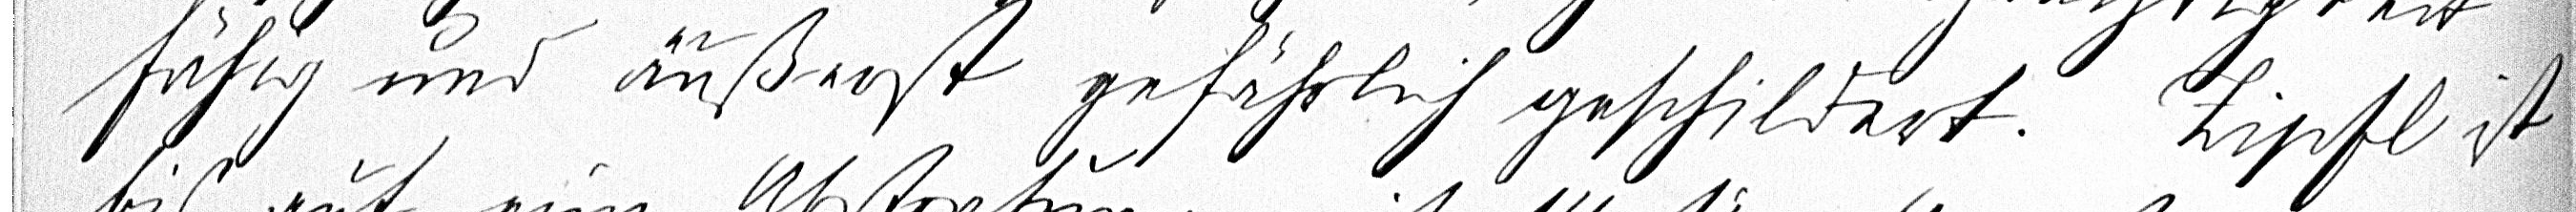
fähig und äußerst gefährlich geschildert. Zipfl ist
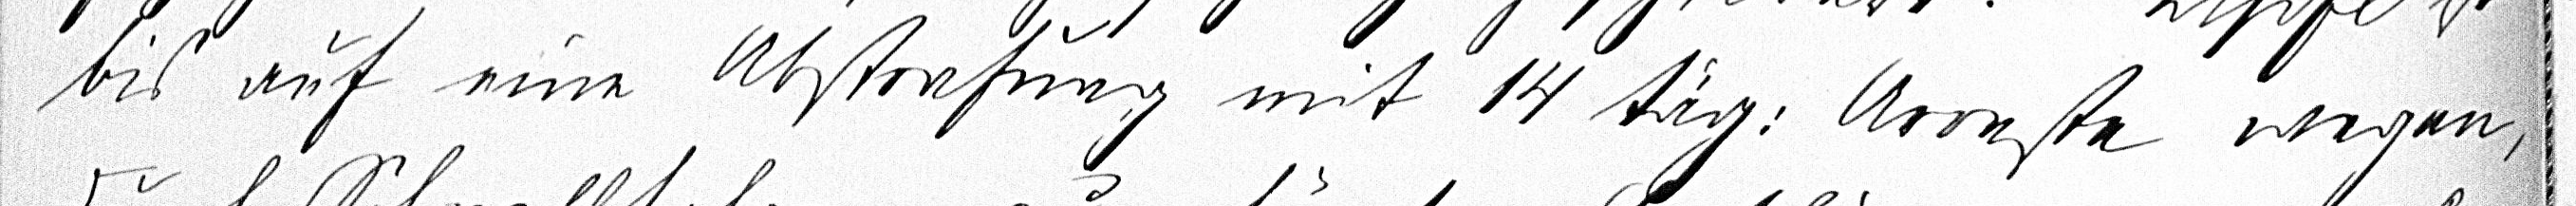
bis auf eine Abstrafung mit 14 täg: Arreste wegen,
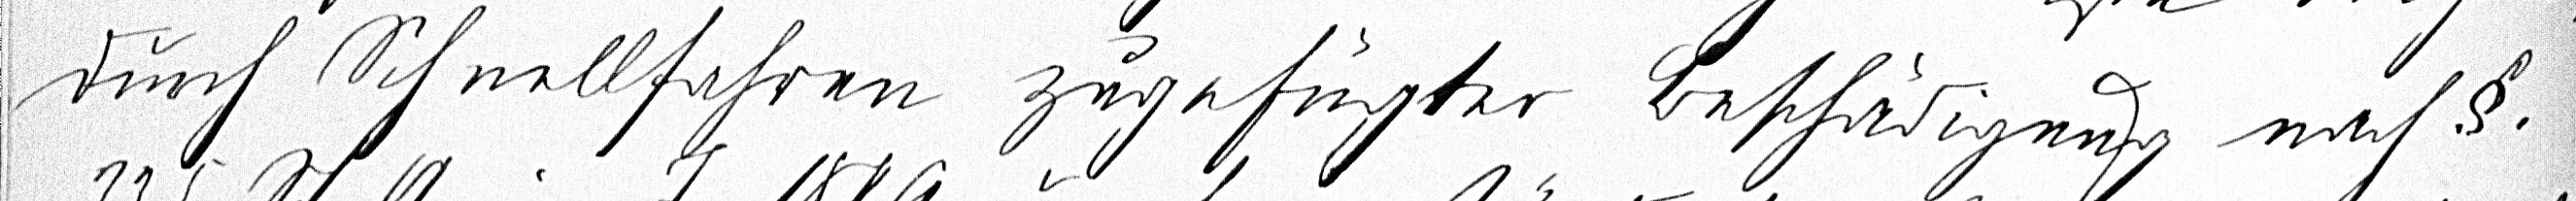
durch Schnellfahren zugefügter Beschädigung nach §.
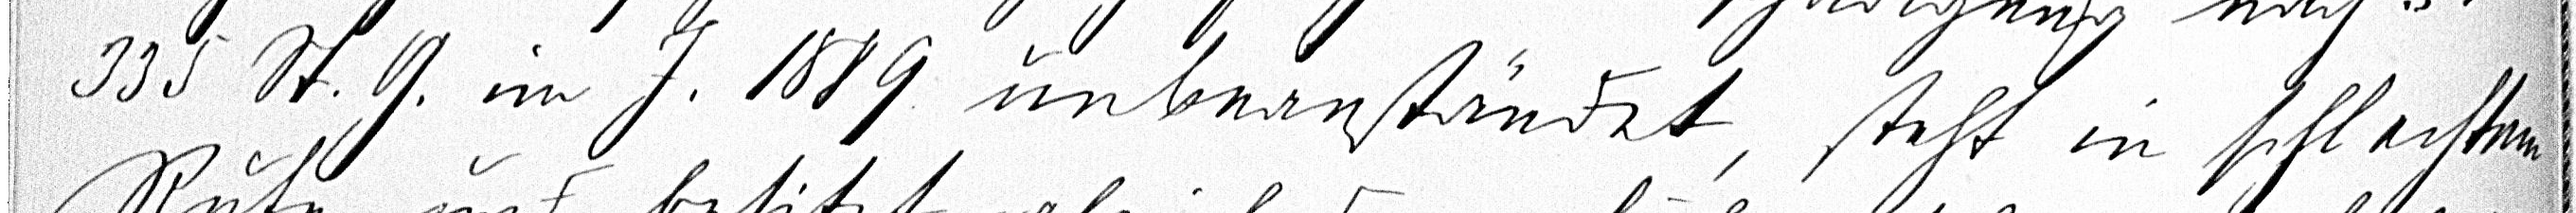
335 St. G. im J. 1889 unbeanständet, steht in schlechtem
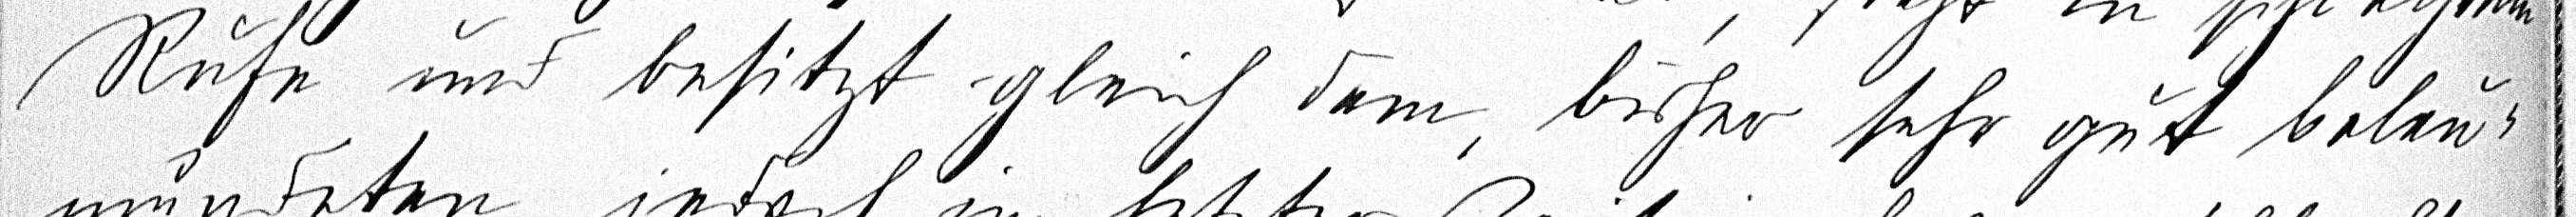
Rufe und besitzt gleich dem, bisher sehr gut beleu¬
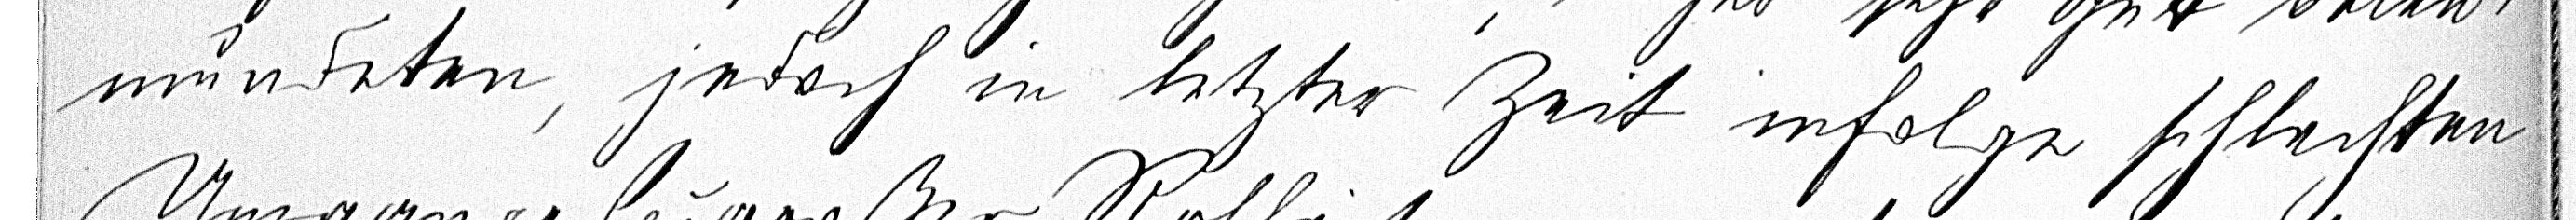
mundeten, jedoch in letzter Zeit infolge schlechten
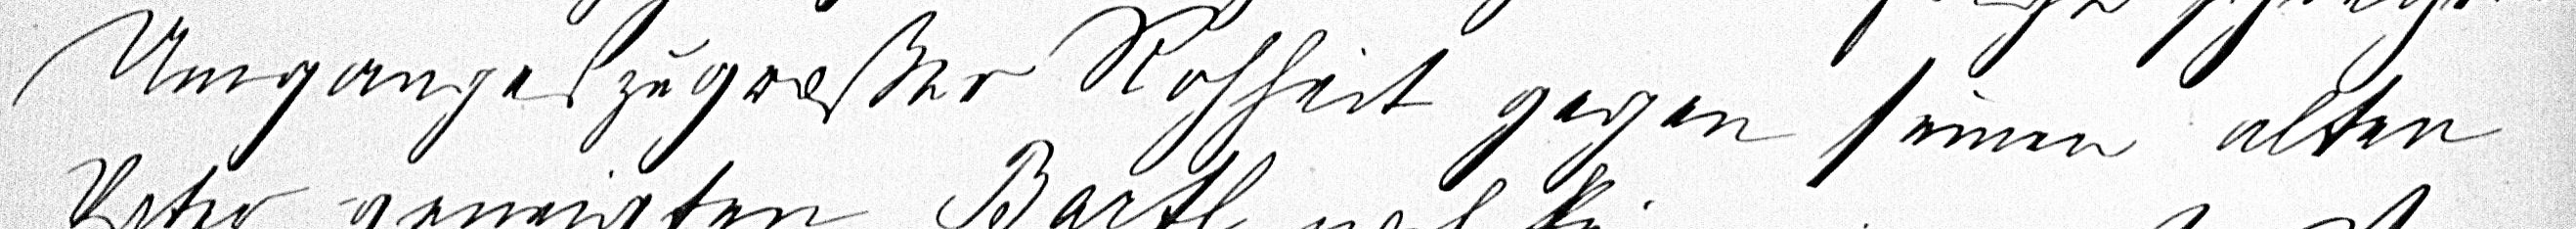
Umganges zu großer Rohheit gegen seinen alten
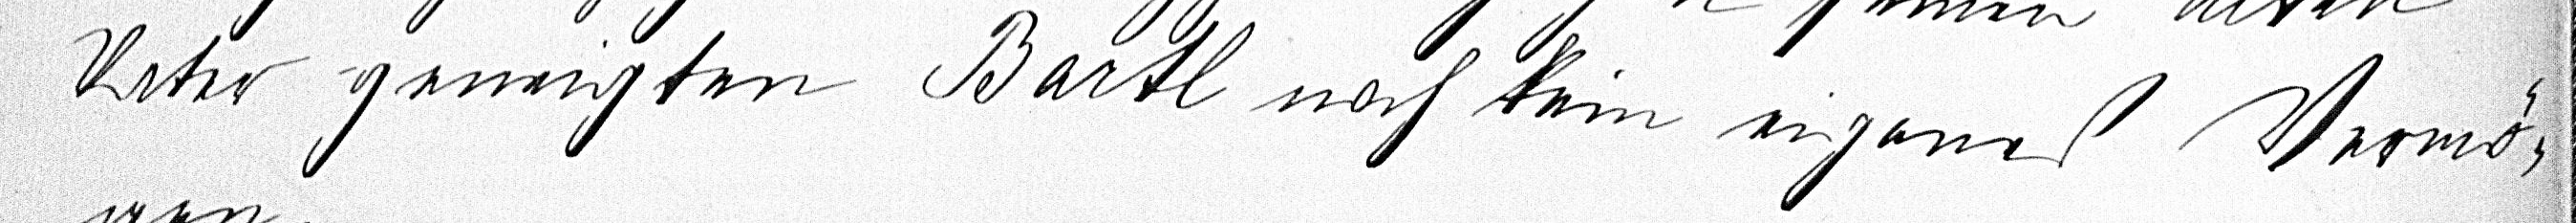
Vater geneigten Bartl noch kein eigenes Vermö¬
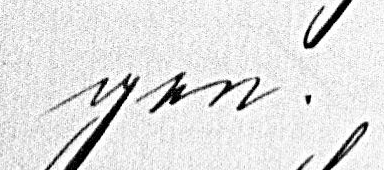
gen.
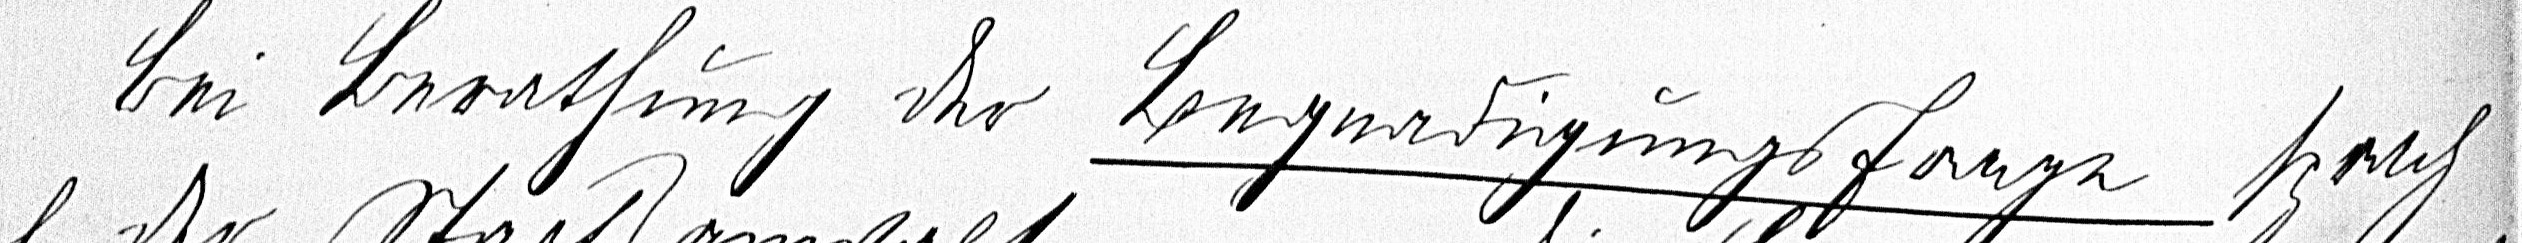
Bei Berathung der Begnadigungsfrage sprach
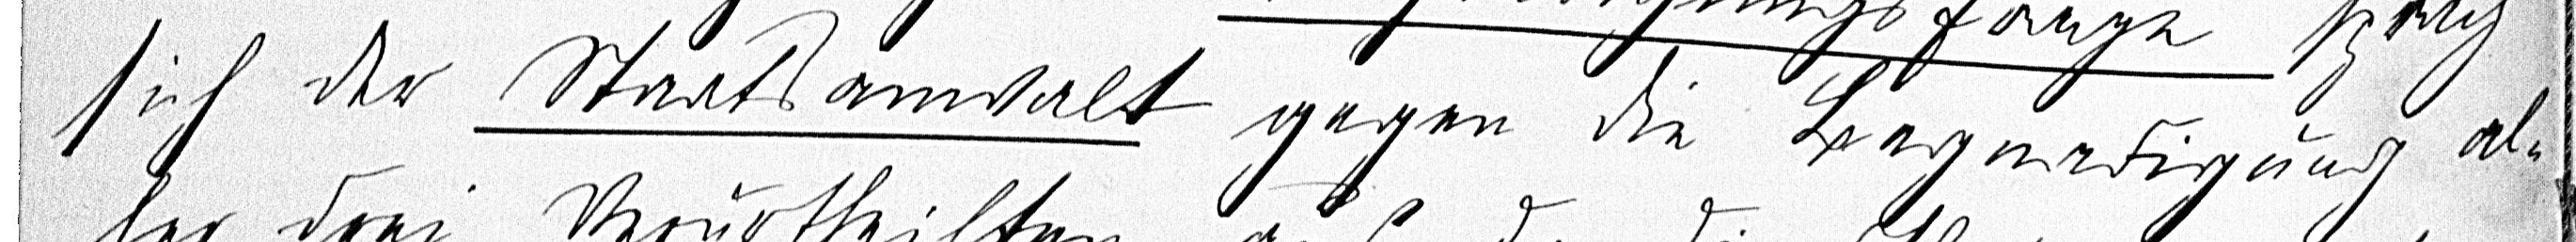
sich der Staatsanwalt gegen die Begnadigung al¬
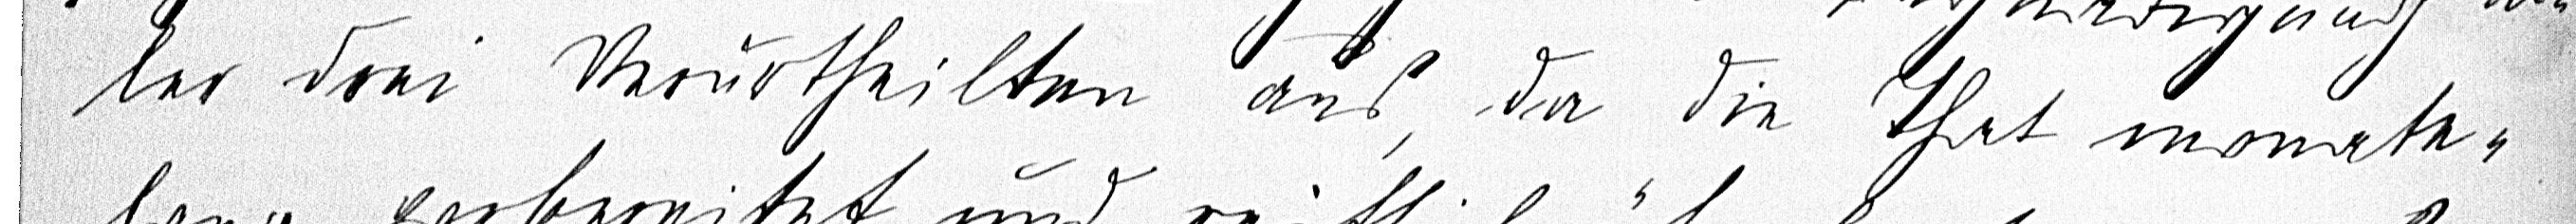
ler drei Verurtheilten aus, da die That monate¬
